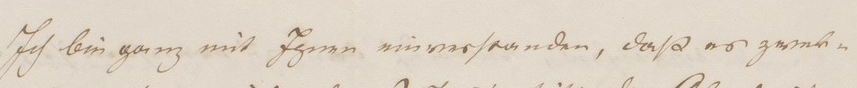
Ich bin ganz mit Ihnen einverstanden, daß es zwek-
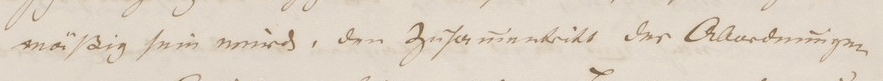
mäßig sein wird, den Zusammentritt der Abordnungen
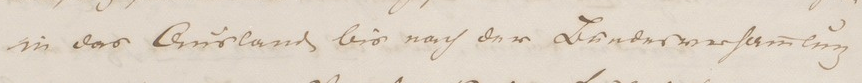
in das Ausland bis nach der Bundesversammlung
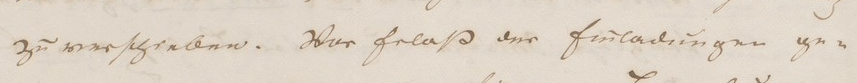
zu verschieben. Vor Erlaß der Einladungen ge-
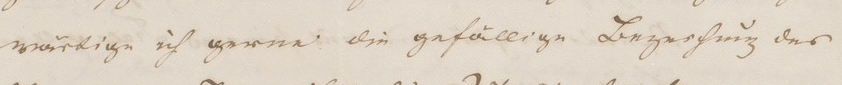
wärtige ich gerne die gefällige Bezeichnung des
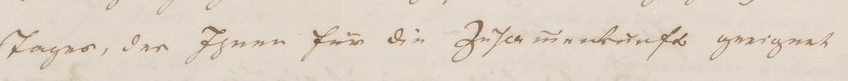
Tages, der Ihnen für die Zusammenkunft geeignet
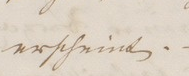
erscheint. –
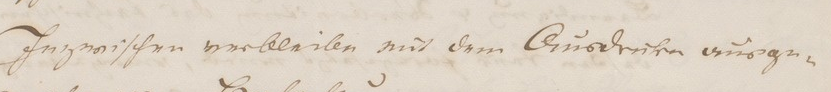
Inzwischen verbleibe mit dem Ausdruke ausge-
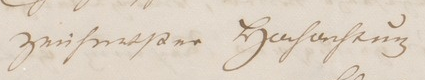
zeichnetster Hochachtung
